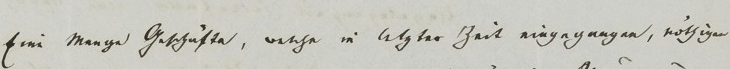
Eine Menge Geschäfte, welche in letzter Zeit eingegangen, nöthigen
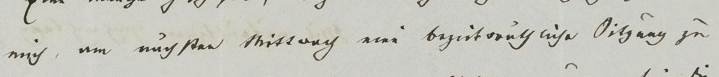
mich, am nächsten Mittwoch eine bezirksräthliche Sitzung zu
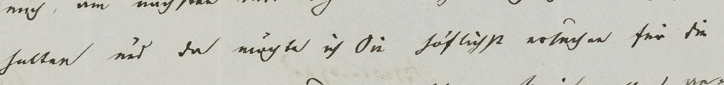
halten und da möchte ich Sie höflichst ersuchen für die
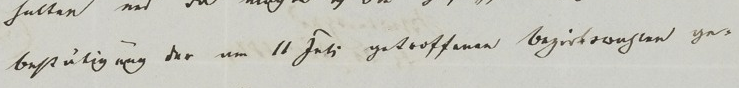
Bestätigung der am 11 Juli getroffenen Bezirkswahlen ge-
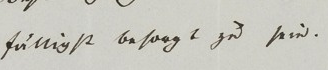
fälligst besorgt zu sein.
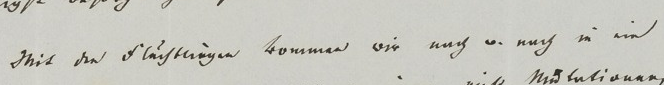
Mit den Flüchtlingen kommen wir nach &. nach in ein
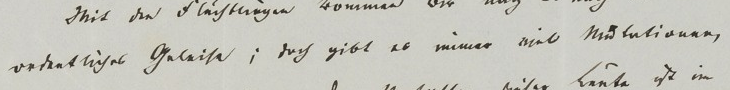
ordentliches Geleise; doch gibt es immer viel Mutationen,
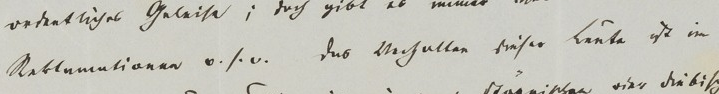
Reklamationen &. s. w. Das Verhalten dieser Leute ist im
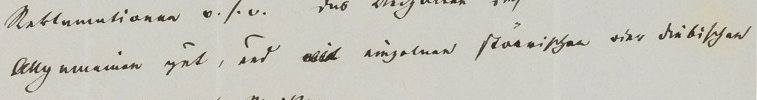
Allgemeinen gut, und mit einzelnen störrischen oder diebischen
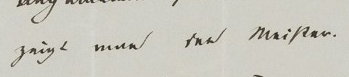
zeigt man den Meister.
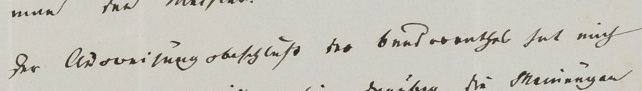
Der Ausweisungsbeschluß des Bundesrathes hat mich
